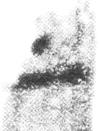二
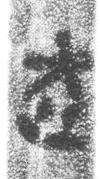本B（本）
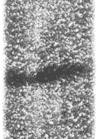一
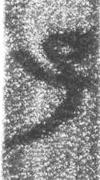子
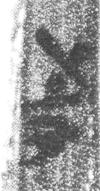時
